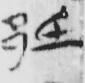邸
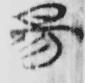昜（陽）
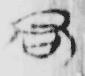君
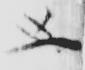之
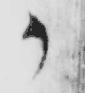人
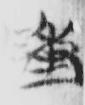○（陳）
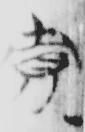賈
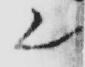乙
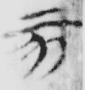亥
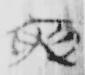寅
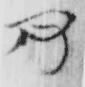尹
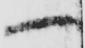一
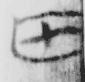甲
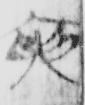寅
